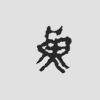黃
